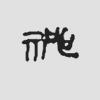神
